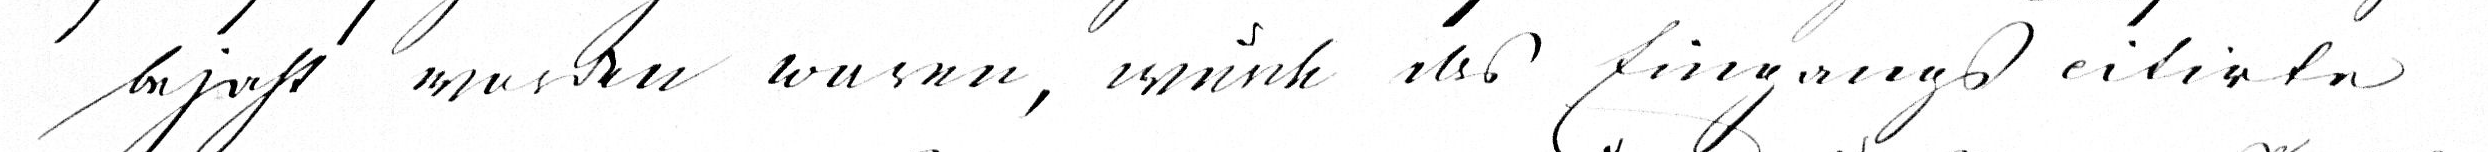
bejaht worden waren, wurck des Eingangs citirte
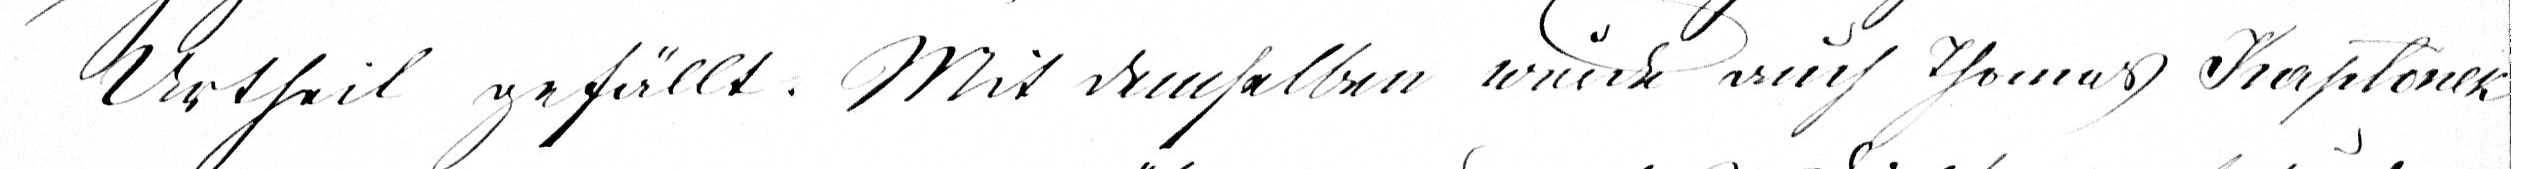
Urtheil gefällt. Mit demselben wurde auch Thomas Kaptonek
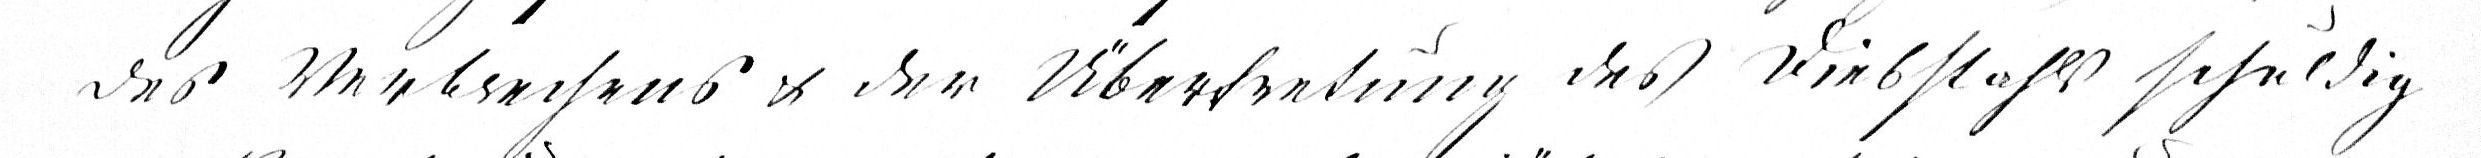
des Verbrechens & der Übertretung des Diebstahls schuldig
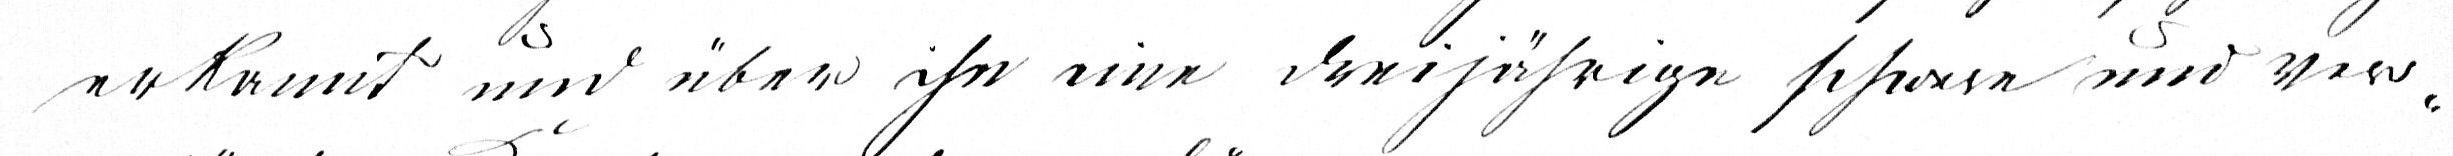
erkannt und über ihn eine Dreijährige schwere und ver¬
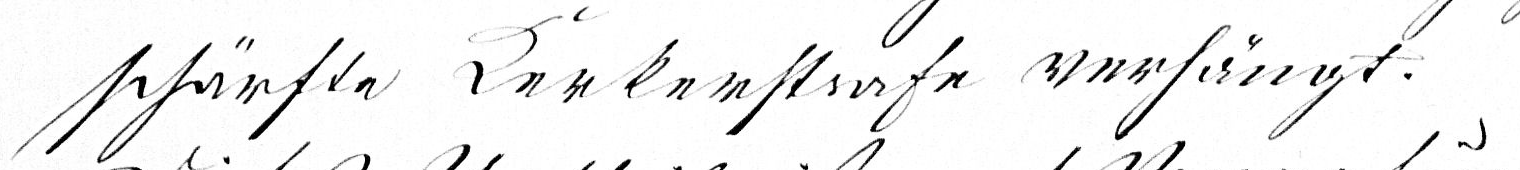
schärfte Kerkerstrafe verhängt.
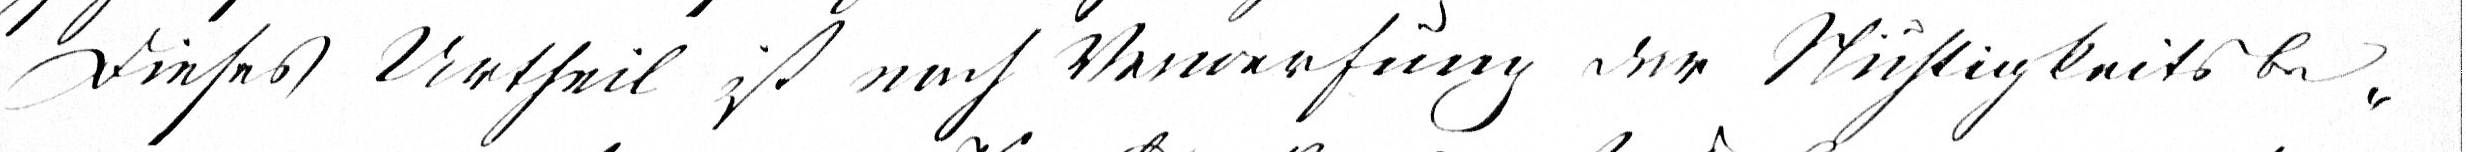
Dieses Urtheil ist nach Verwerfung der Nustigkeitsbe¬
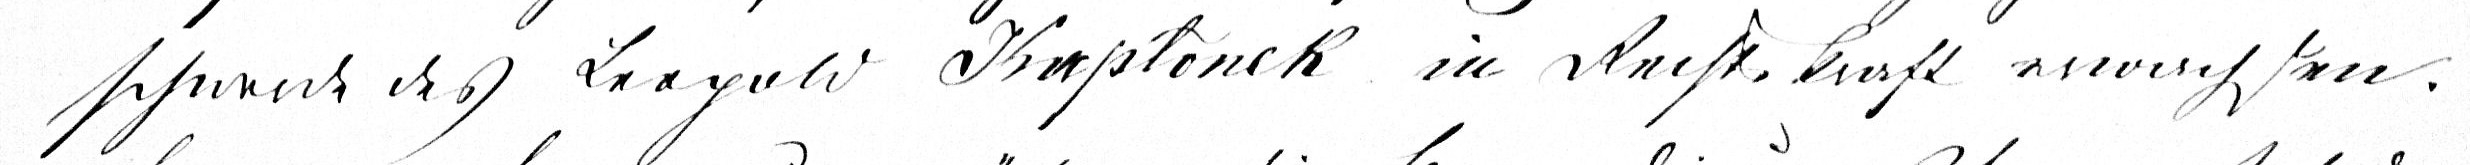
schwerde des Leopold Kaptonek in Rechtskraft erwachsen.
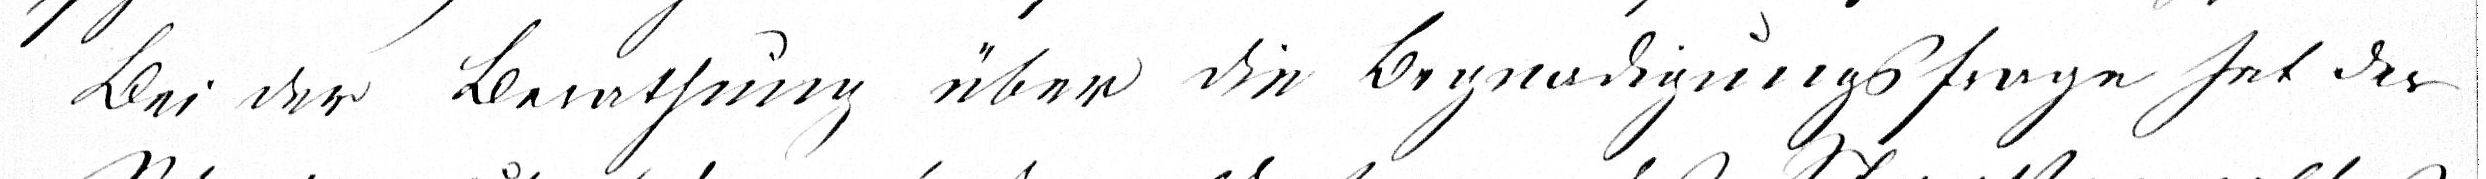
Bei der Berathung über die Begnadigungsfrage hat der
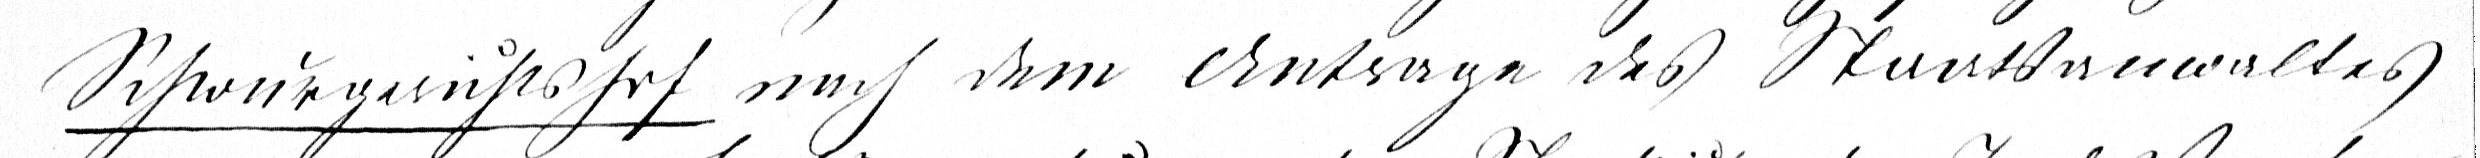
Schwurgerichtshof nach dem Antrage des Staatsanwaltes
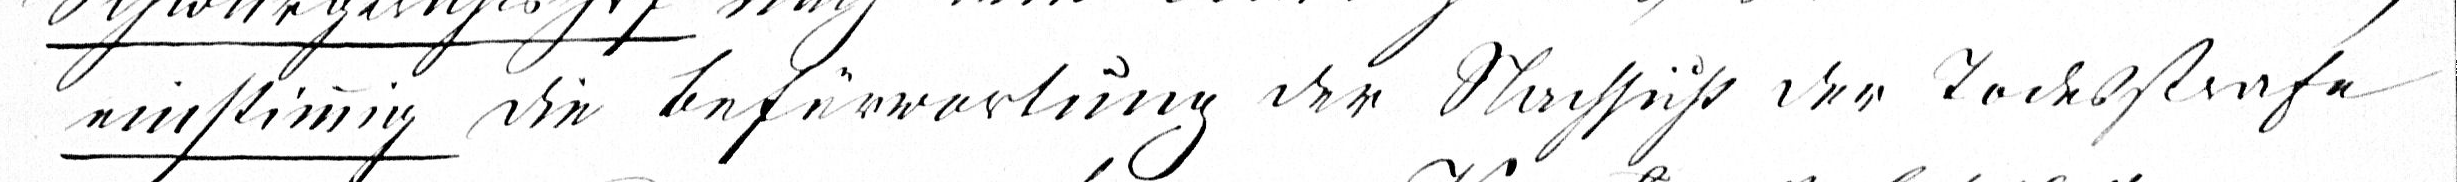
einstimmig die Befürwortung der Nachsicht der Todesstrafe
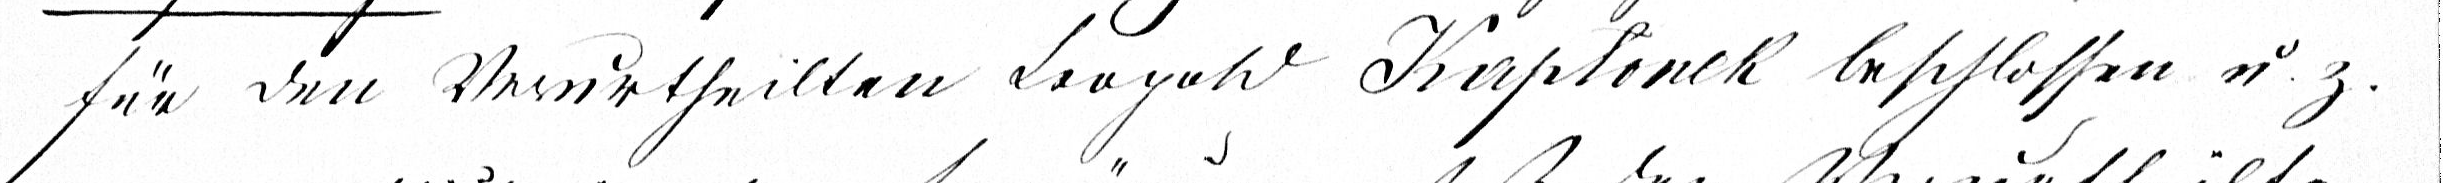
für den Verurtheilten Leopold Kaptonek beschlossen u. z.
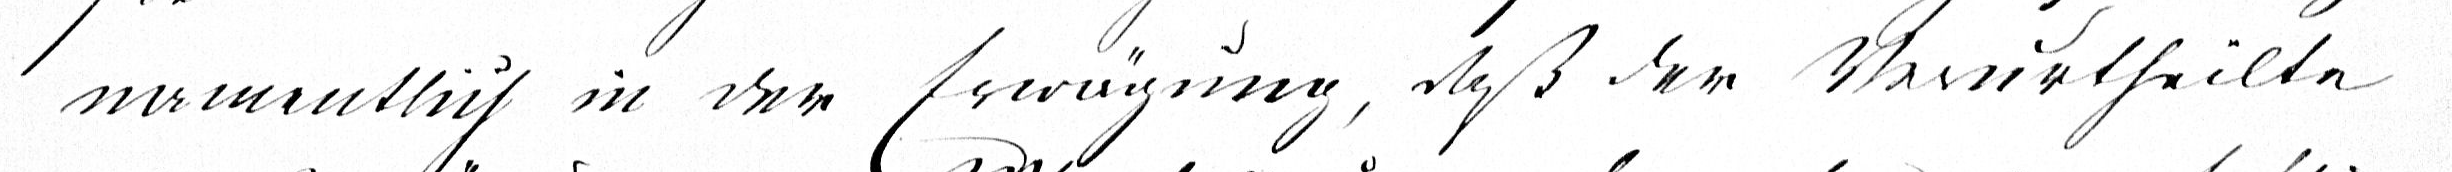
namentlich in der Erwägung, daß der Verurtheilte
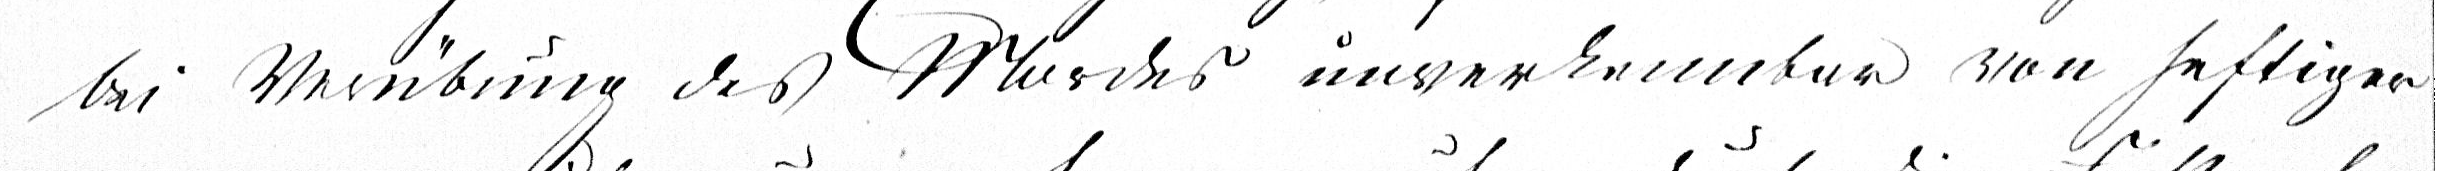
bei Verübung des Mordes unverkennbar von heftiger
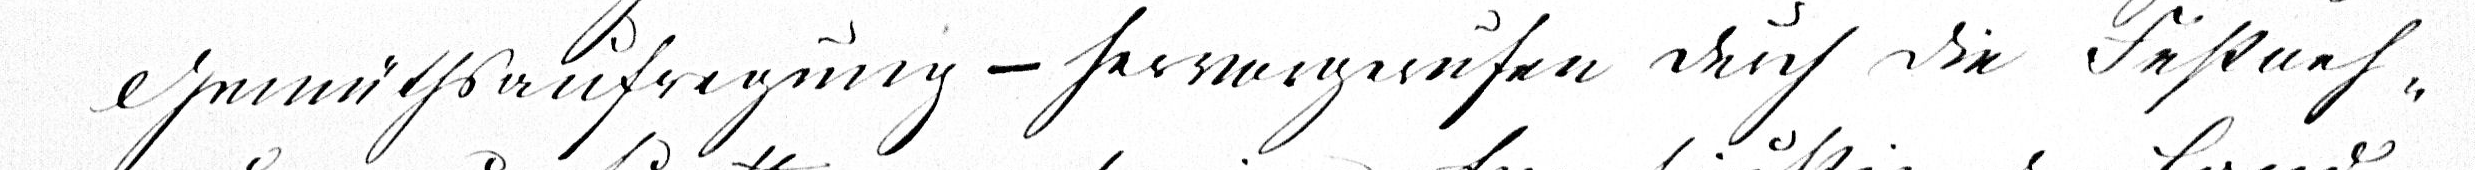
Gemüthsaufregung - hervorgerufen durch die Festneh¬
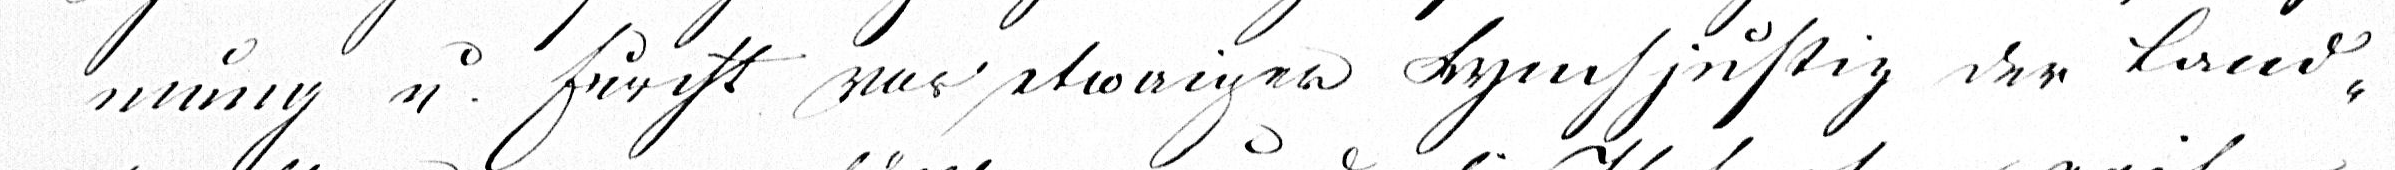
mung u. Furcht vor etwaiger Lxxjustiz der Land¬
